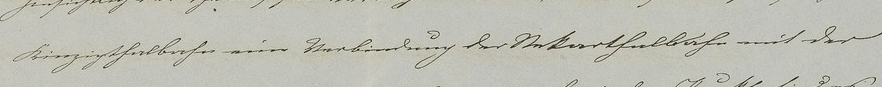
Kinzigthalbahn eine Verbindung der Nekarthalbahn mit der
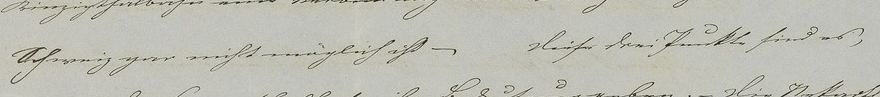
Schweiz gar nicht möglich ist. – Diese drei Punkte sind es,
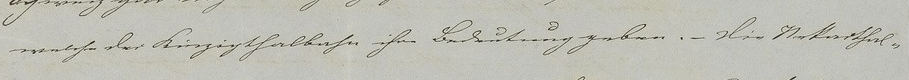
welche der Kinzigthalbahn ihre Bedeutung geben. – Die Nekarthal -
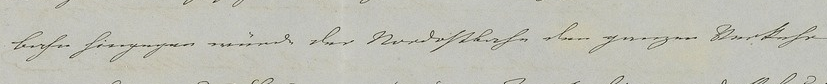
bahn hingegen würde der Nordostbahn den ganzen Verkehr
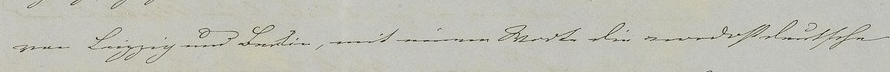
von Leipzig und Berlin, mit einem Worte die nordostdeutsche
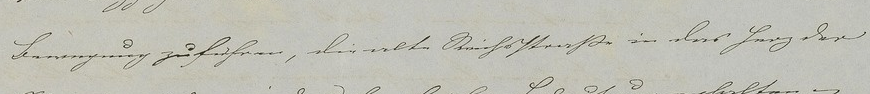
Bewegung zuführen, die alte Reichsstraße in das Herz der
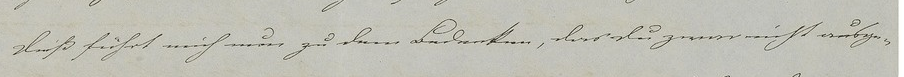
Dieß führt mich nun zu dem Bedenken, das du zwar nicht ausge-
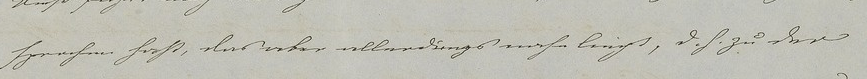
sprochen hast, das aber allerdings nahe liegt, d. h. zu der
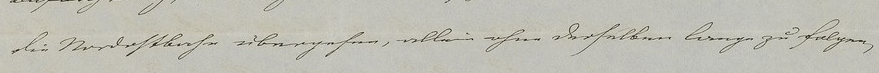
die Nordostbahn übergehen, allein ohne derselben lange zu folgen,
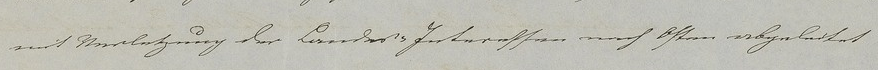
mit Verletzung der Landes-Interessen nach Osten abgeleitet
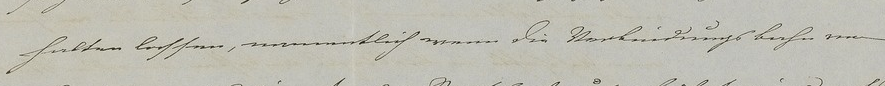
halten lassen, namentlich wenn die Verbindungsbahn von
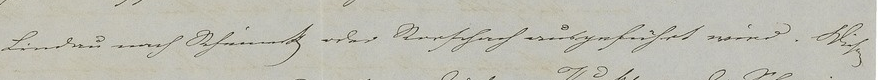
Lindau nach Rheineck oder Rorschach ausgeführt wird. Dieser
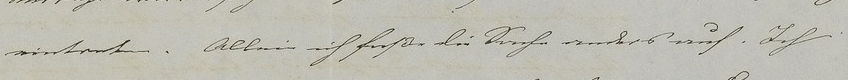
eintreten. Allein ich faße die Sache anders auf. Ich
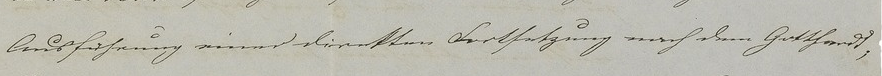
Ausführung einer direkten Fortsetzung nach dem Gotthardt,
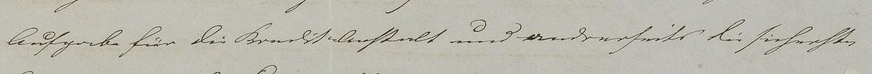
Aufgabe für die Kredit-Anstalt und andrerseits die sicherste
